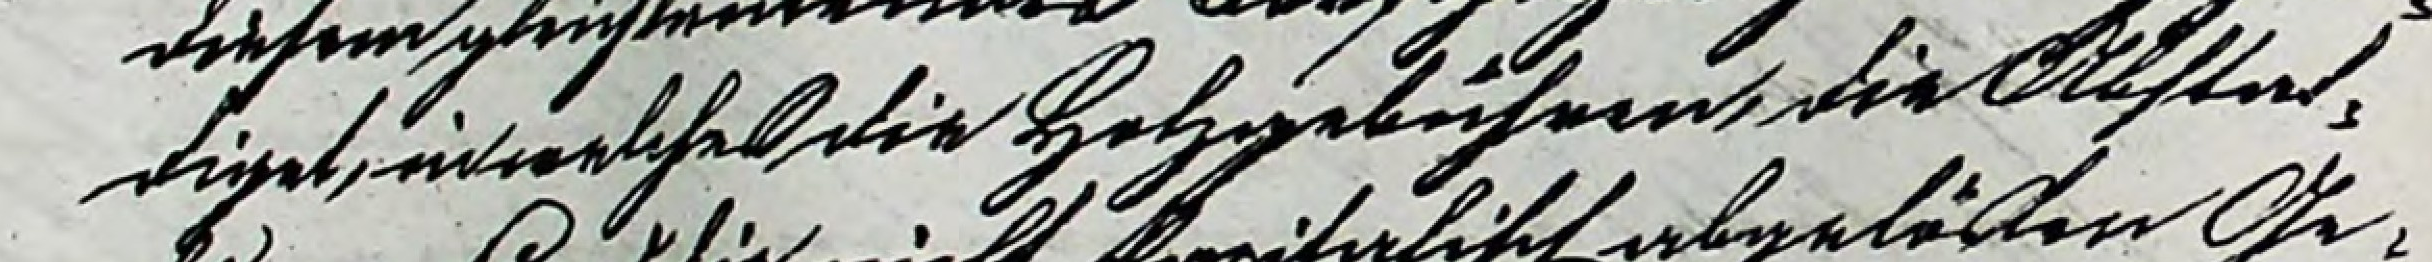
digel, in welches die Holzgebühren, die Abstat„
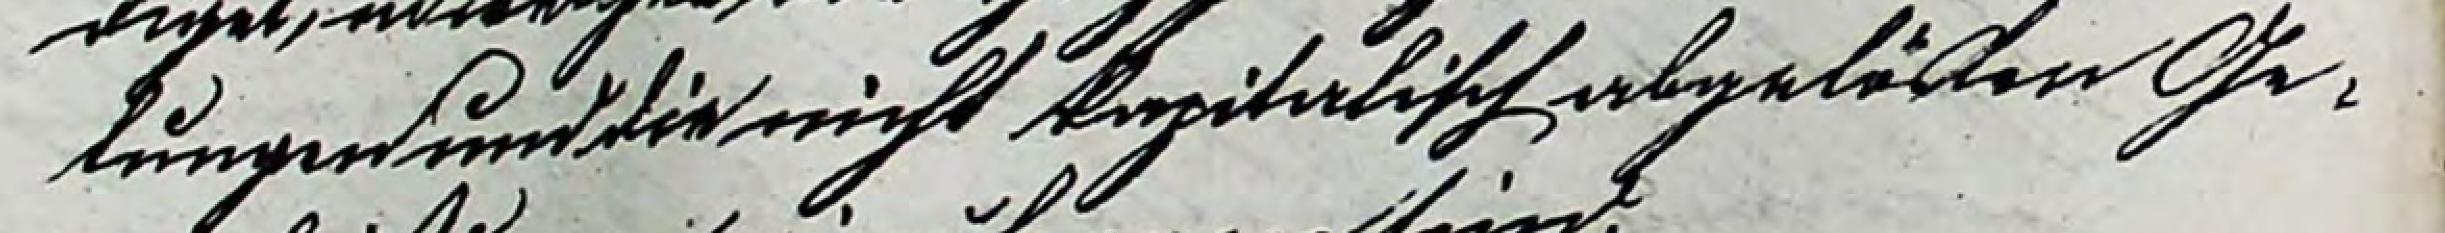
tungen und die nicht kapitalisch abgelösten Ge„
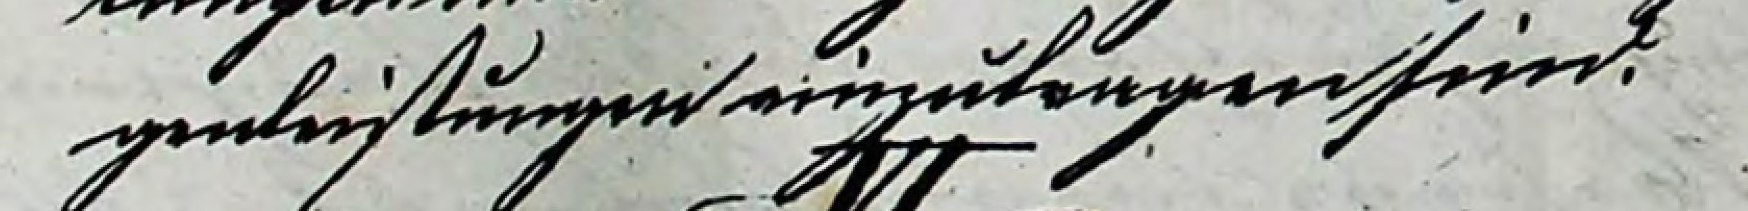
genleistungen einzutragen sind.
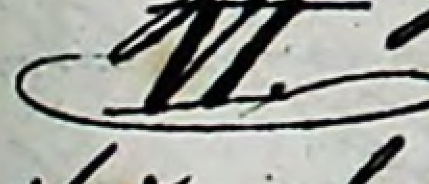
VI.
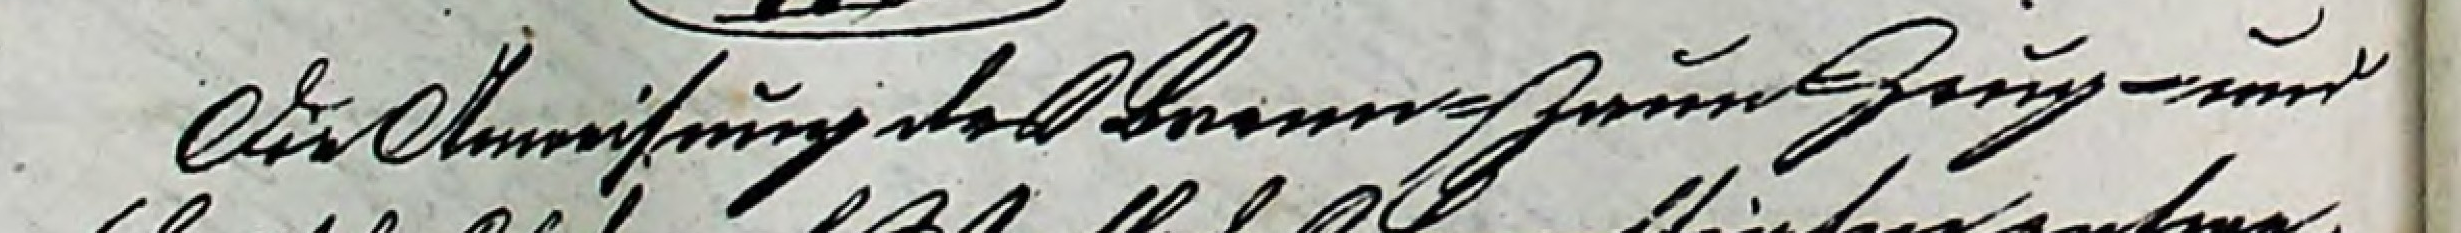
Die Anweisung des Brenn=Zaun=Zeug= und
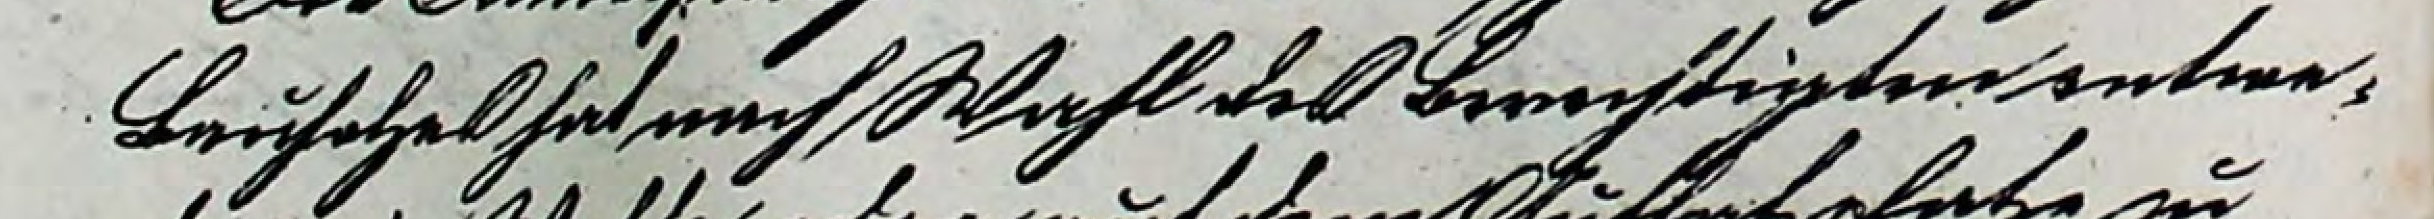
Lauholzes hat nach Wahl des Berechtigten entwe„
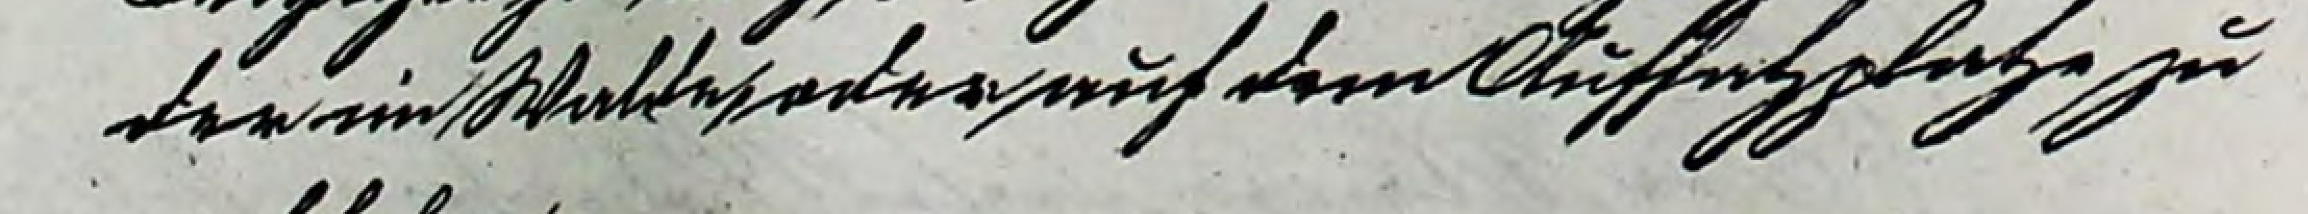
der im Walde, oder auf dem Aufsatzplatze zu
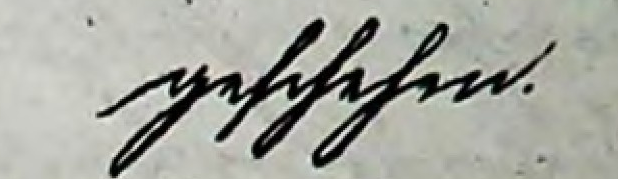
geschehen.
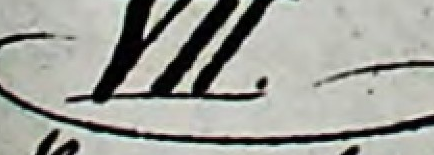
VII.
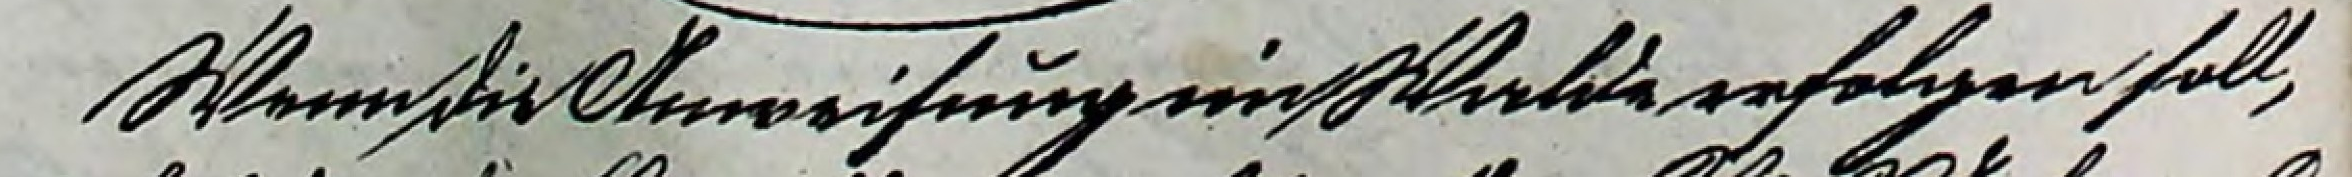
Wenn die Anweisung im Walde erfolgen soll,
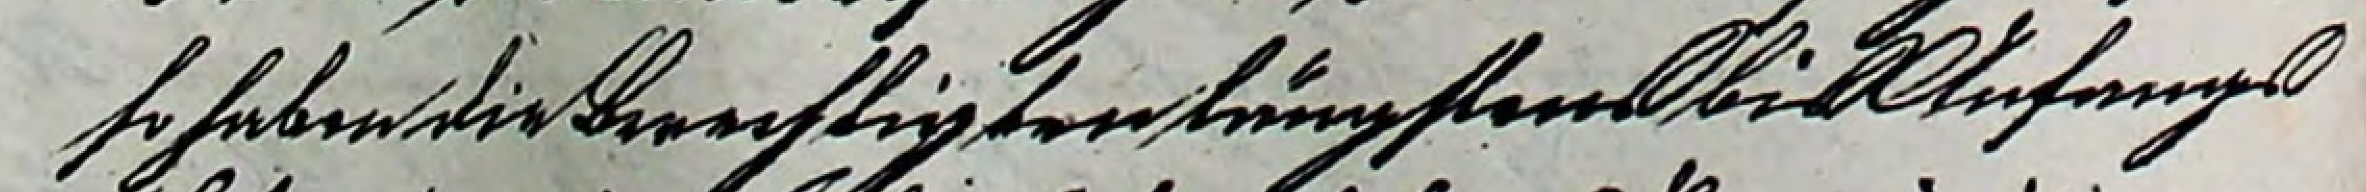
so haben die Berechtigten längstens bis Anfanges
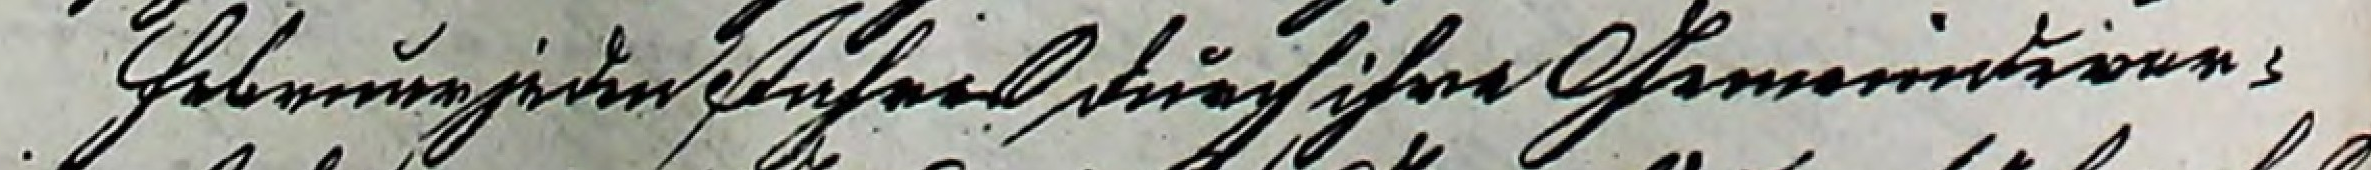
Februar jeden Jahres durch ihre Gemeindever„
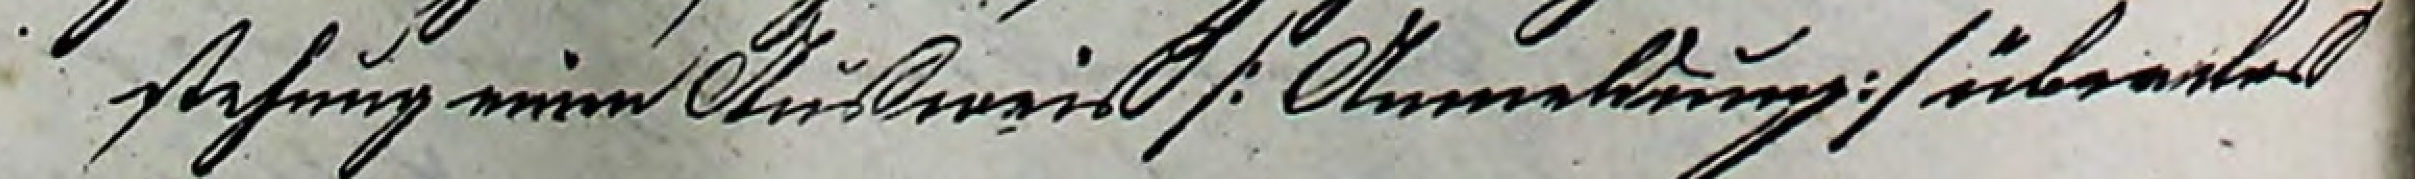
stehung einen Ausweis /: Anmeldung :/ über des
